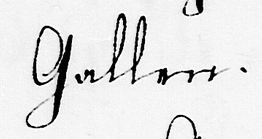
Gallen.
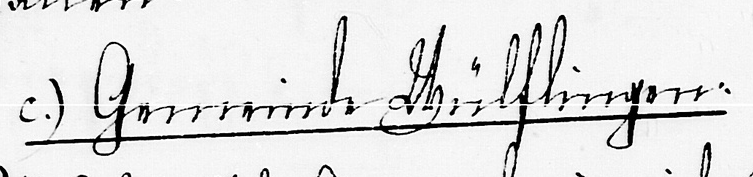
c.) Gemeinde Wülflingen.
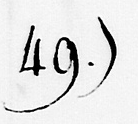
49.)
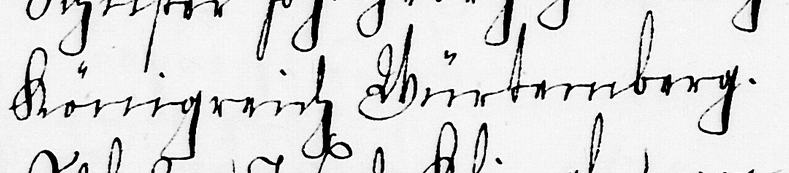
Königreich Würtemberg.
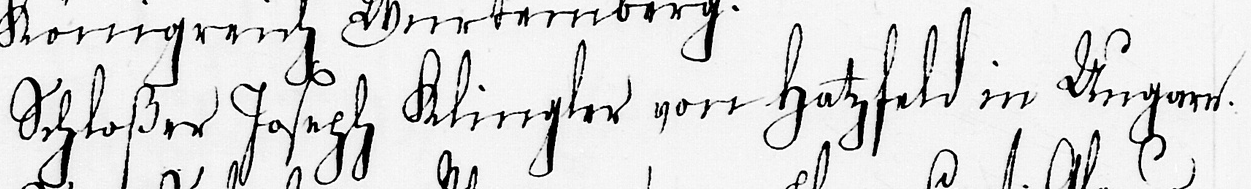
chloßer Joseph Klingler von Hatzfeld in Ungarn.
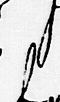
f.)
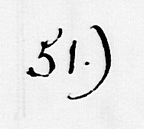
52.)
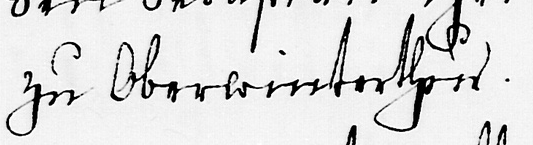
zu Oberwinterthur.
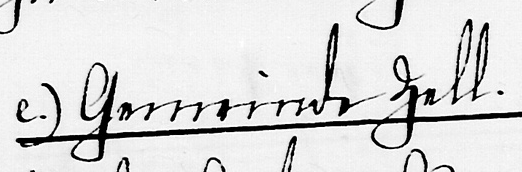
e.) Gemeinde Zell.
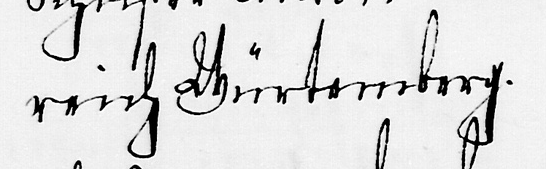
reich Würtemberg.
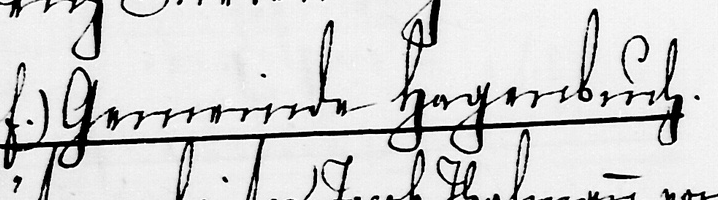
Gemeinde Hagenbuch.
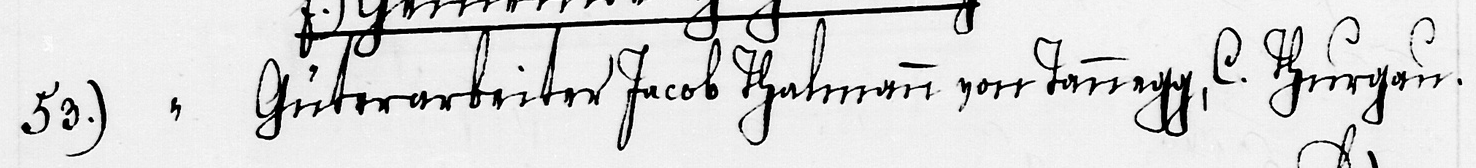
53.) “ Güterarbeiter Jacob Thalmann von Tannegg, C. Thurgau.
